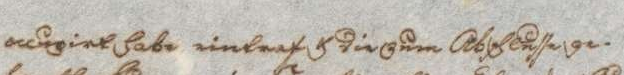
occupirt habe eintraf & die zum Abschlusse ge-
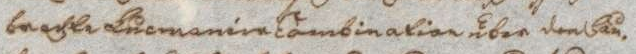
brachte Lucmanier Combination über den Hau-
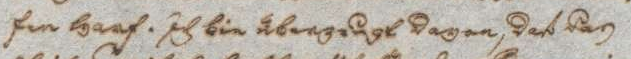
fen warf. Ich bin überzeugt davon, daß das
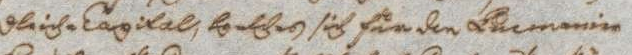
gleiche Capital, welches sich für den Lucmanier
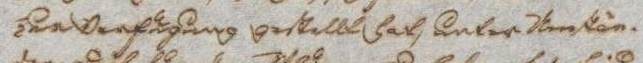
zur Verfüngung gestellt hat, unter Umstän-
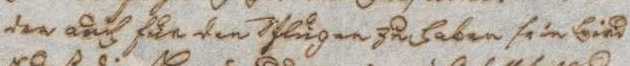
den auch für den Splügen zu haben sein wird
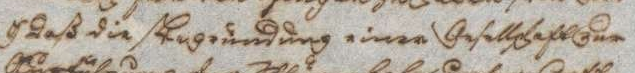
daß die Begründung einer Gesellschaft zur
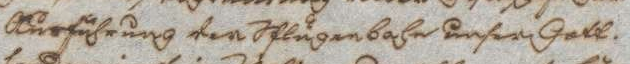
Ausführung der Splügenbahn unser Gott-
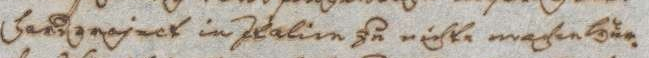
hardproject in Italien zu nichte machen wür-
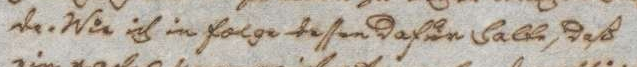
de. Wie ich in Folge dessen dafür halte, daß
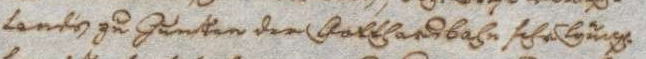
land's zu Gunsten der Gotthardbahn sehr wünsch-
